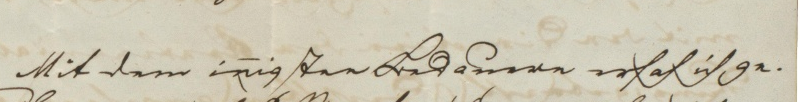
Mit dem innigsten Bedauern ersah ich ge-
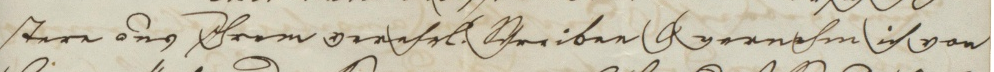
stern aus Ihrem verehrl. Schreiben & vernahm ich von
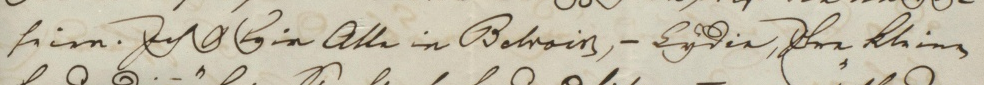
seien. Ich & wir Alle in Belvoir, – Lydie, Ihre «kleine
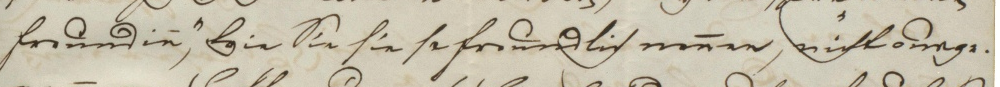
Freundinn», wie Sie sie so freundlich nennen, nicht ausge-
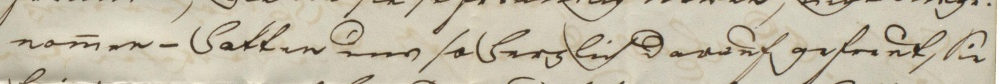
nommen – hatten uns so herzlich darauf gefreut, Sie
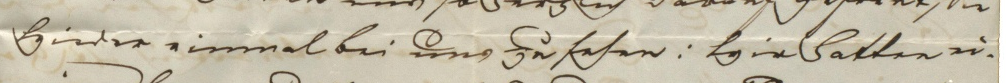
wieder einmal bei uns zu sehen (wir hatten ei-
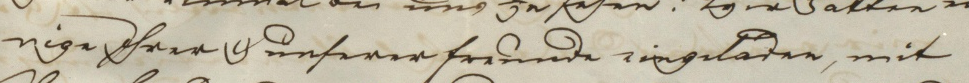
nige Ihrer & unserer Freunde eingeladen, mit
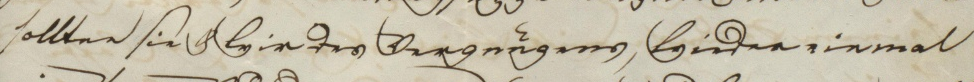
sollten Sie & wir des Vergnügens, wieder einmal
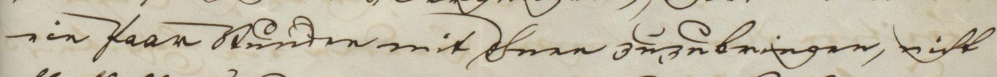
ein Paar Stunden mit Ihnen zuzubringen, nicht
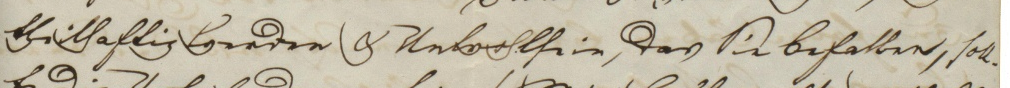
theilhaftig werden & Unwohlsein, das Sie befallen, soll-
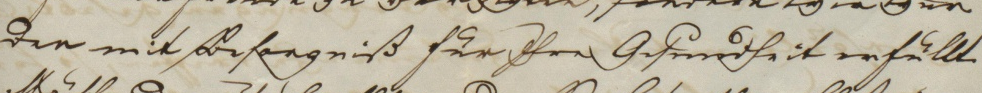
den mit Besorgniß für Ihre Gesundheit erfüllt.
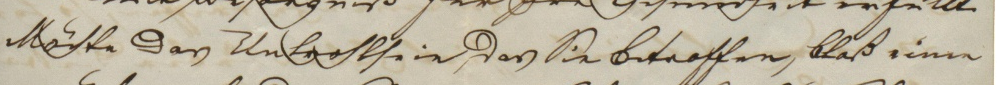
Möchte das Unwohlsein, das Sie betroffen, bloß einen
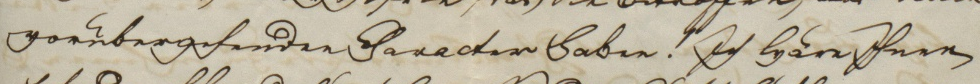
vorübergehenden Character haben! Ich wäre Ihnen
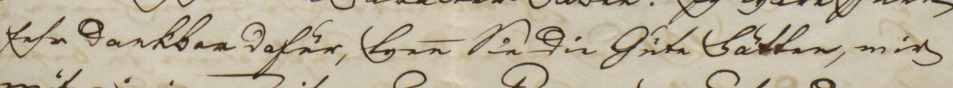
sehr dankbar dafür, wenn Sie die Güte hätten, mir
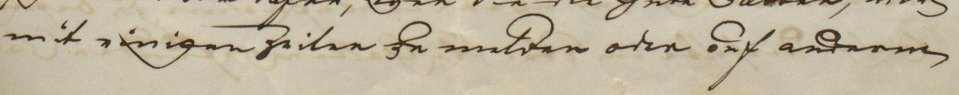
mit einigen Zeilen zu melden oder auf anderm
